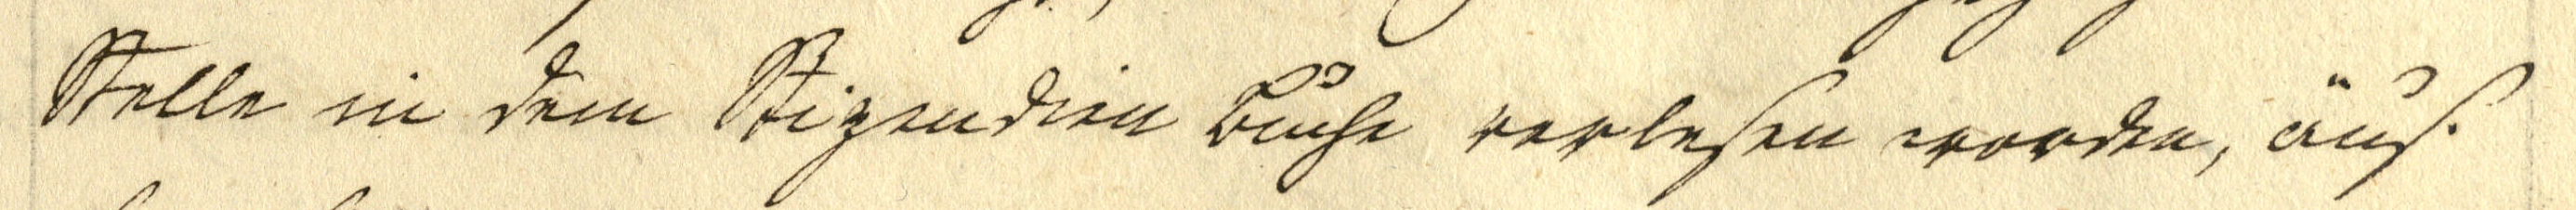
Stelle in dem Stipendien Buche verlesen worden, äus-
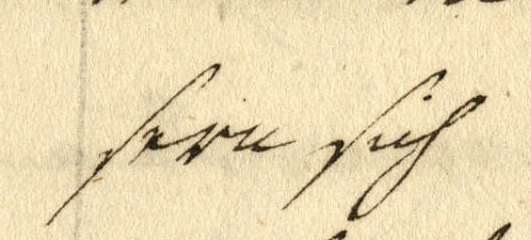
sern sich
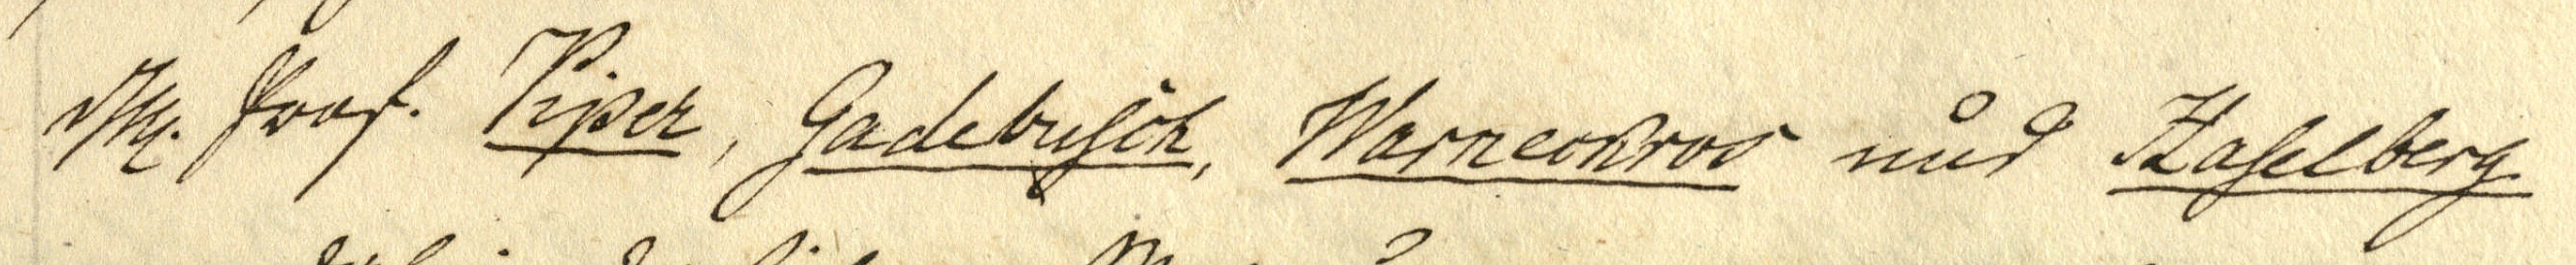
dhh. Prof. Piper, Gadebusch, Warneckros und Haselberg
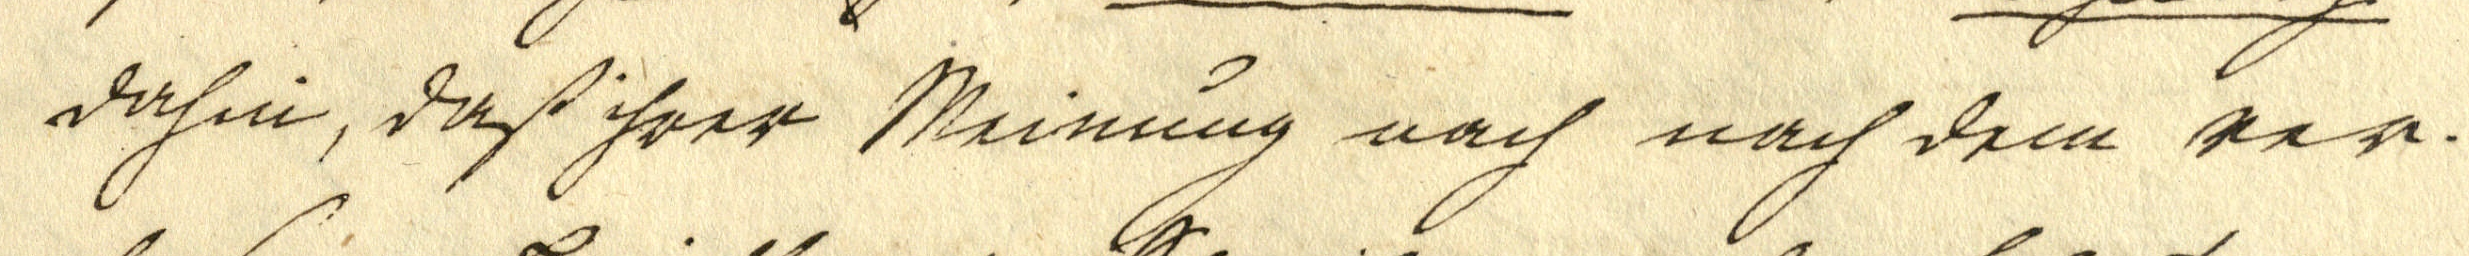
dahin, daß ihrer Meinung nach nach dem ver-
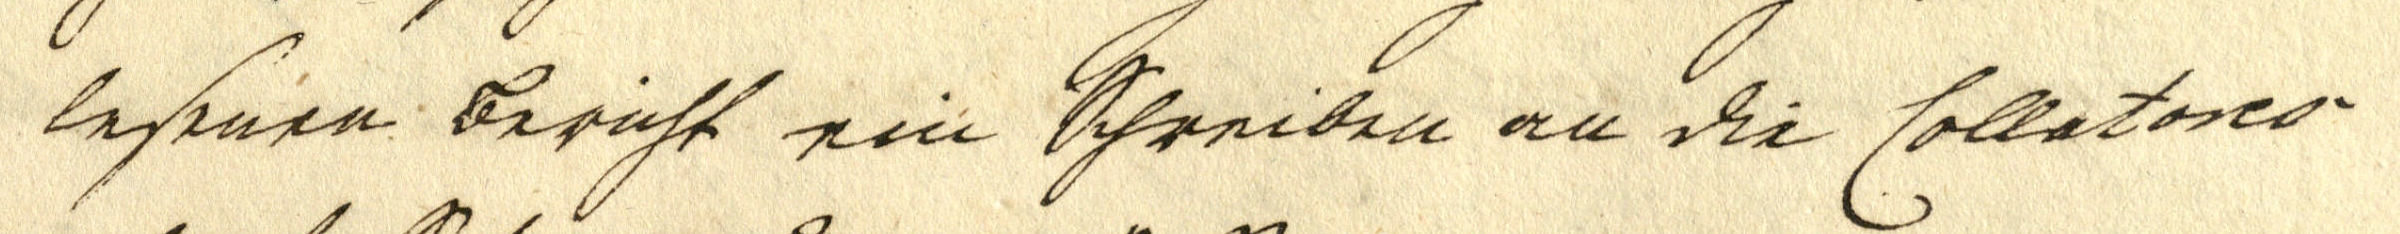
lesenen Bericht ein Schreiben an die Collatores
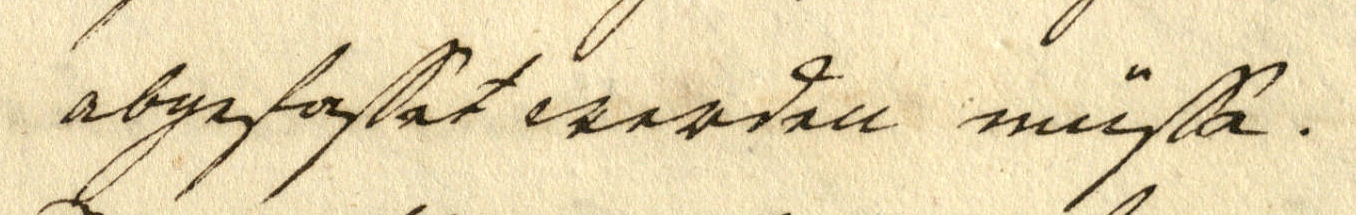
abgefasset werden müsse.
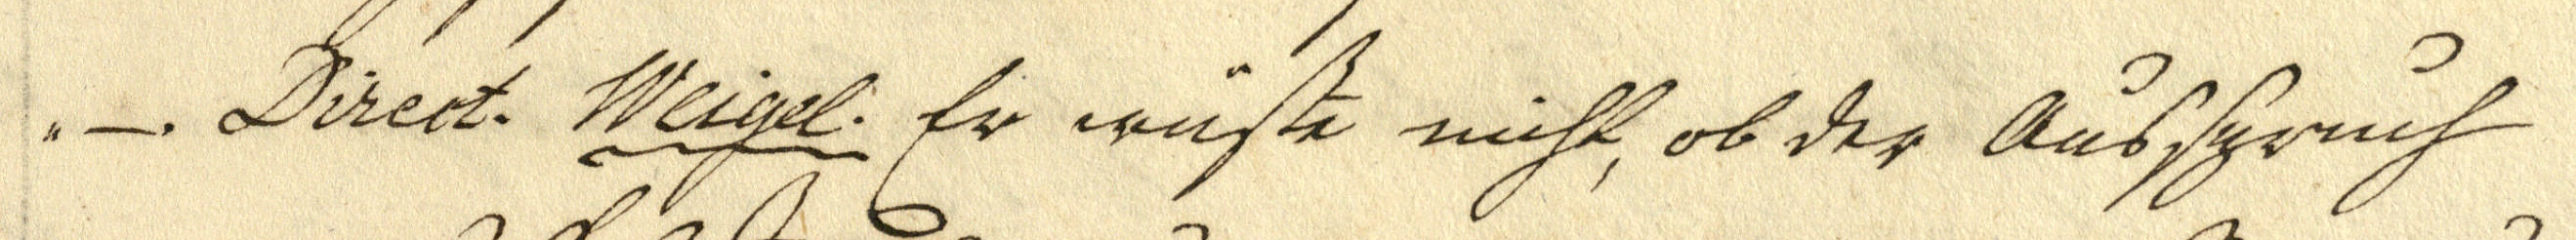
" - " Direct. Weigel. Er wüßte nicht, ob der Ausspruch
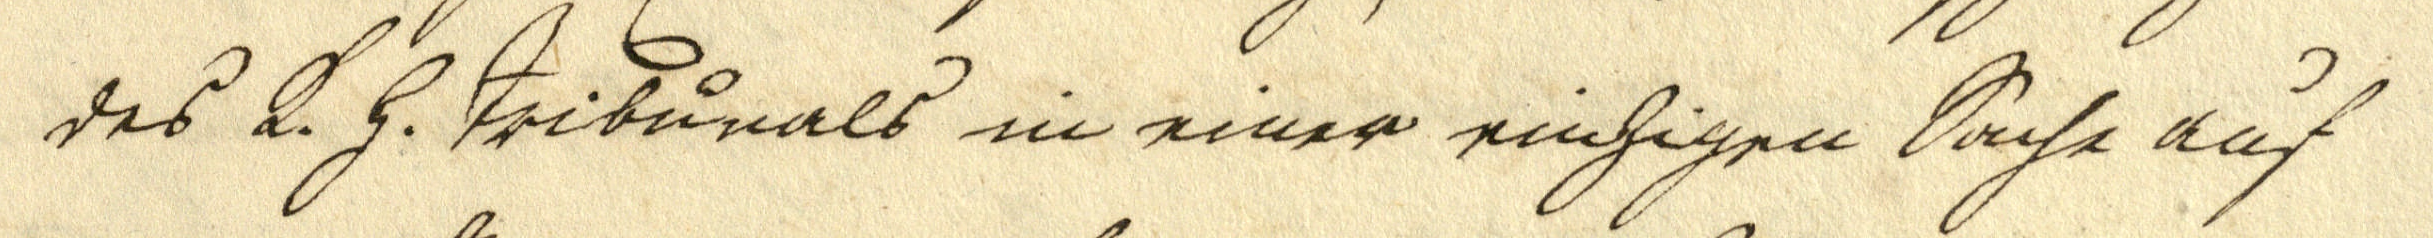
des K. H. Tribunals in einer einzigen Sache auf
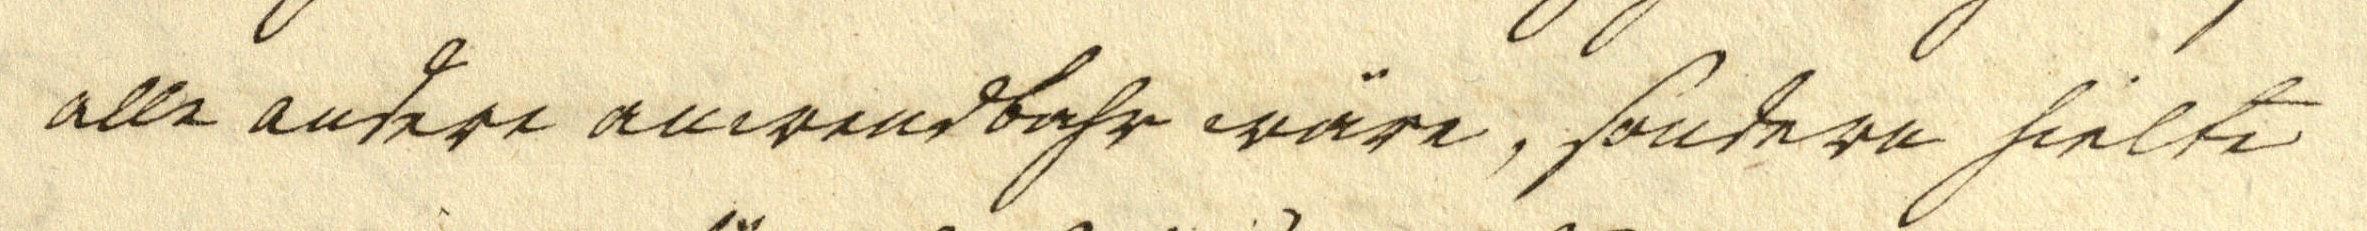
alle andere anwendbahr wäre, sondern hielte
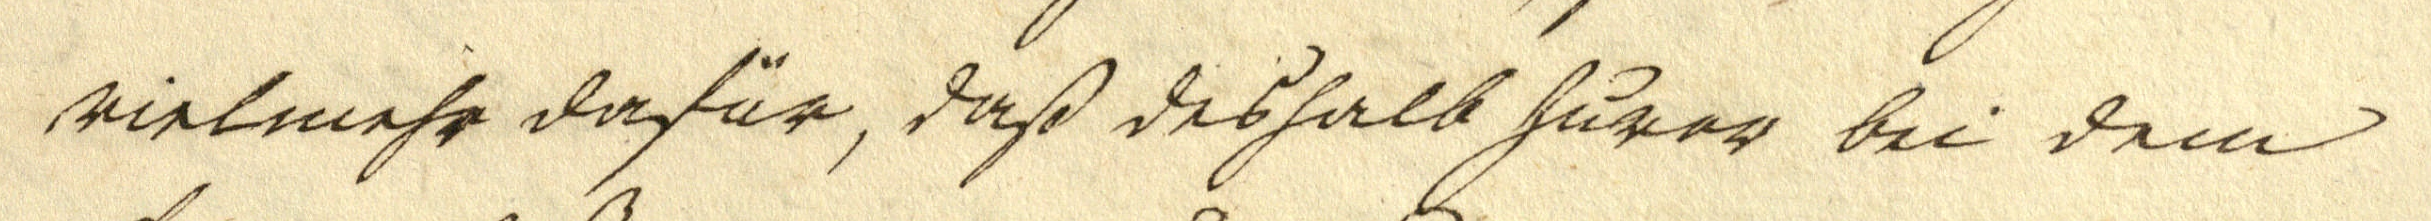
vielmehr dafür, daß deshalb zuvor bei dem
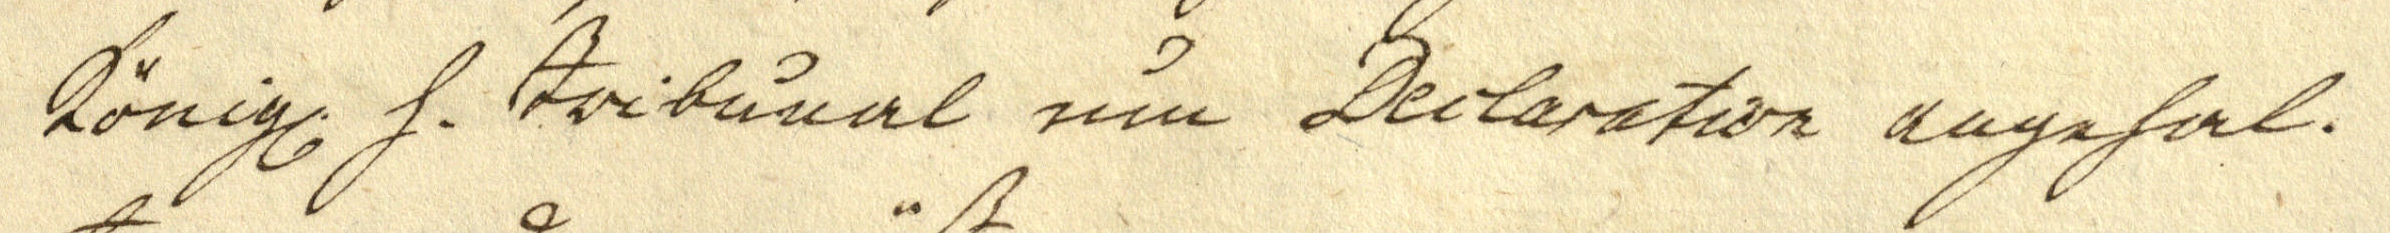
Königl. h. Tribunal um Declaration angehal-
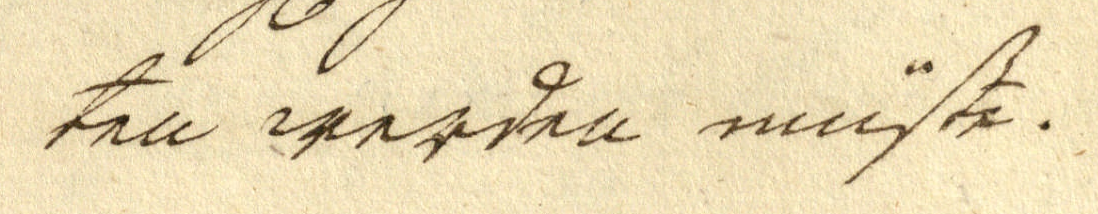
ten werden müßte.
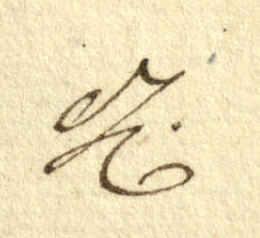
dh.
